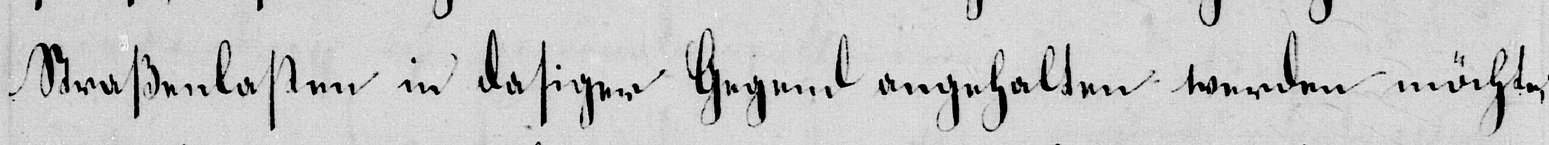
Straßenlasten in dasiger Gegend angehalten werden möchte,
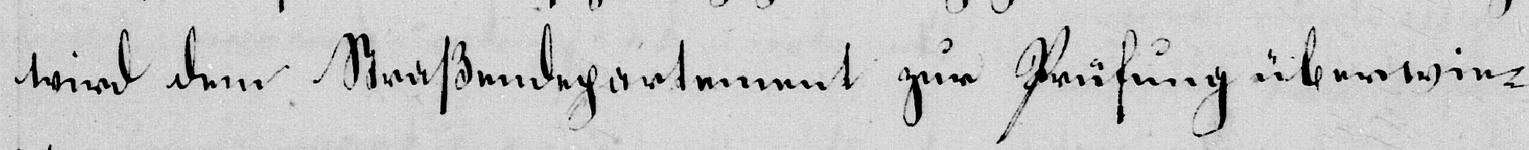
wird dem Straßendepartement zur Prüfung überwie¬
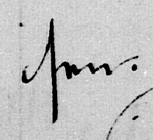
sen.
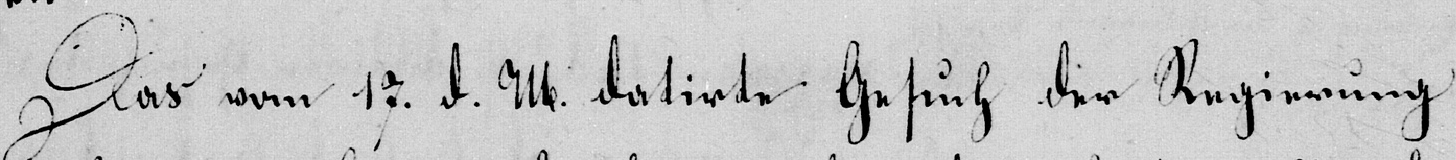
Das vom 17. d. M. datirte Gesuch der Regierung
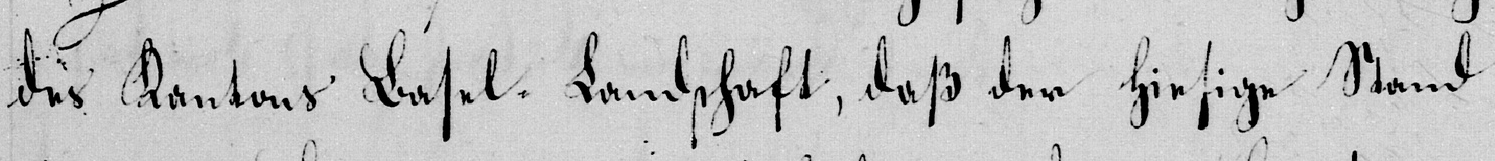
des Kantons Basel-Landschaft, daß der hiesige Stand
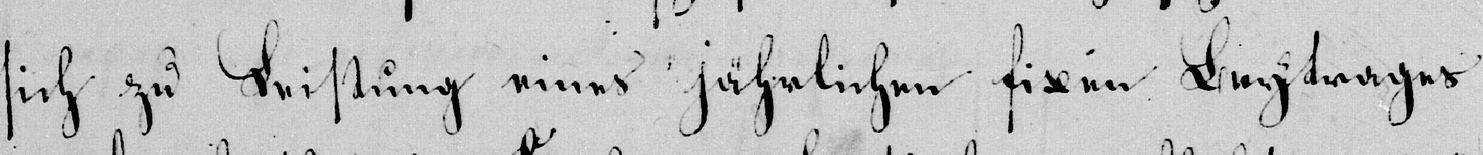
sich zu Leistung eines jährlichen fixen Beytrages
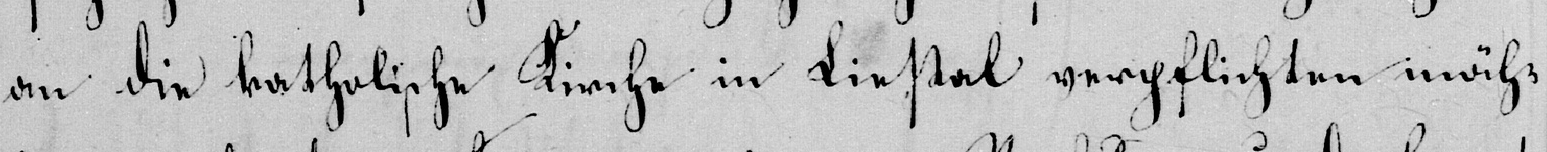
an die katholische Kirche in Liesthal verpflichten möch¬
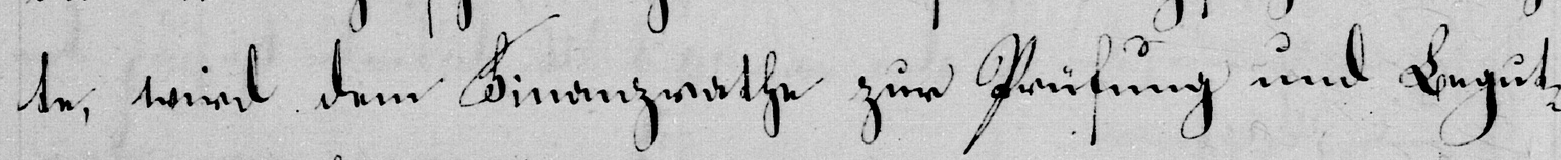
te, wird dem Finanzrathe zur Prüfung und Begut¬
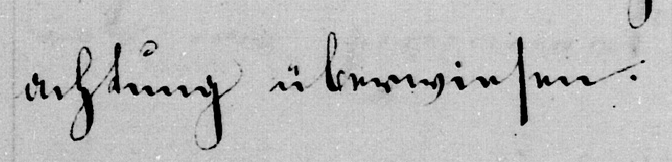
achtung überwiesen.
